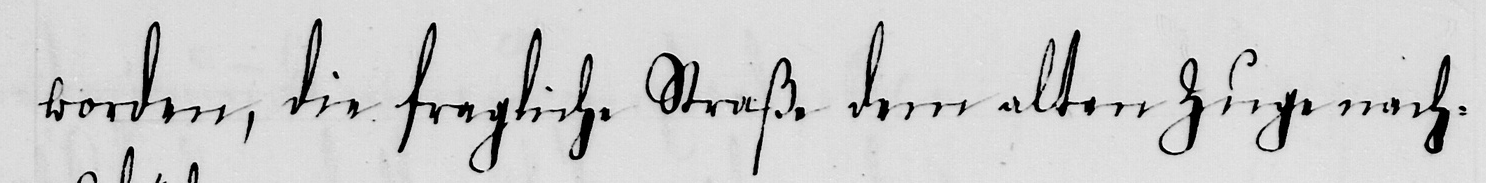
worden, die fragliche Straße dem alten Zuge nach¬
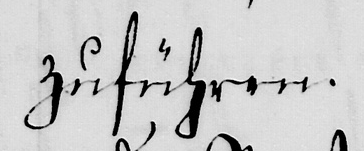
zuführen.
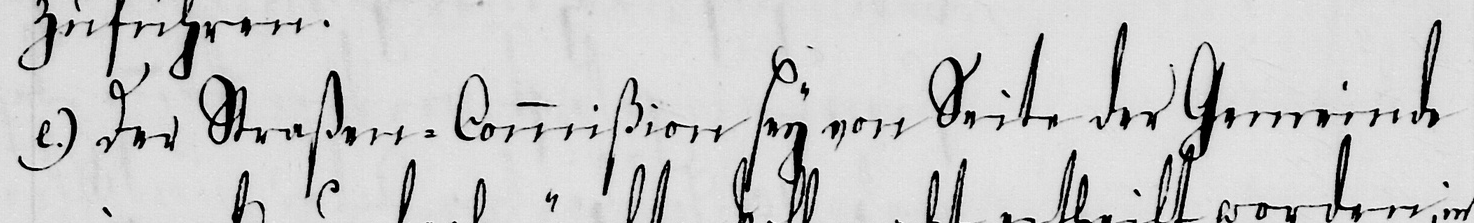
e.) Der Straßen-Commißion sey von Seite der Gemeinde
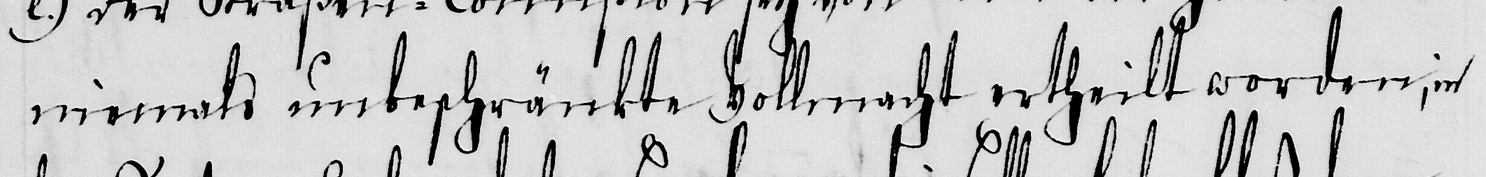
niemals unbeschränkte Vollmacht ertheilt worden, in
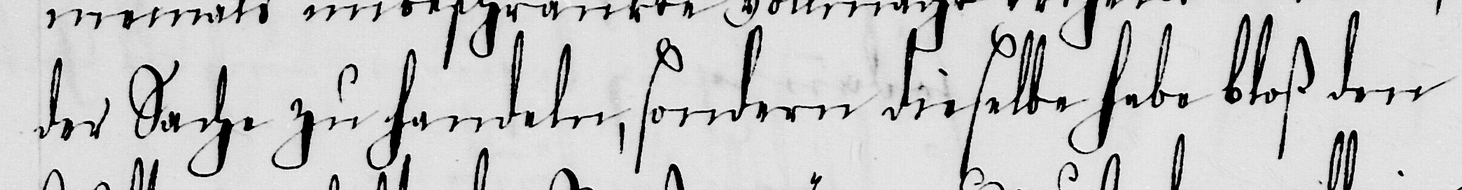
der Sache zu handeln, sondern dieselbe habe bloß den
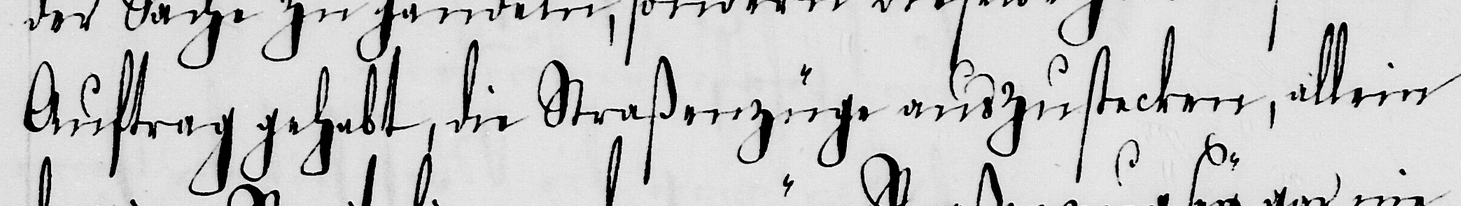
Auftrag gehabt, die Straßenzüge auszustecken, allein
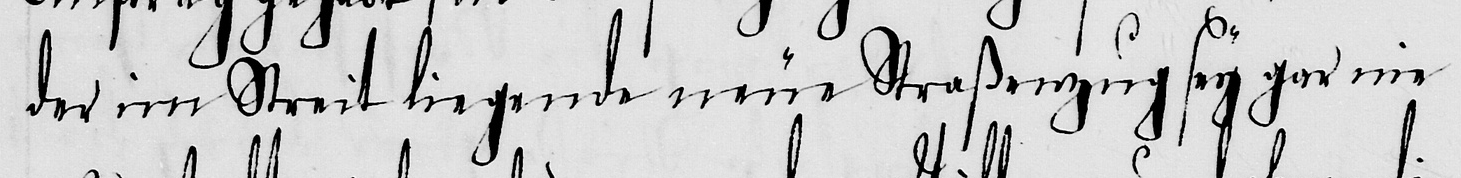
der im Streit liegende neue Straßenzug sey gar nie
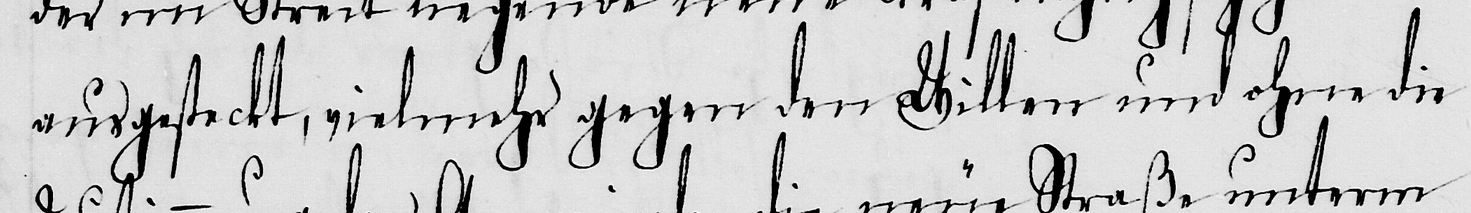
ausgesteckt, vielmehr gegen den Willen und ohne die
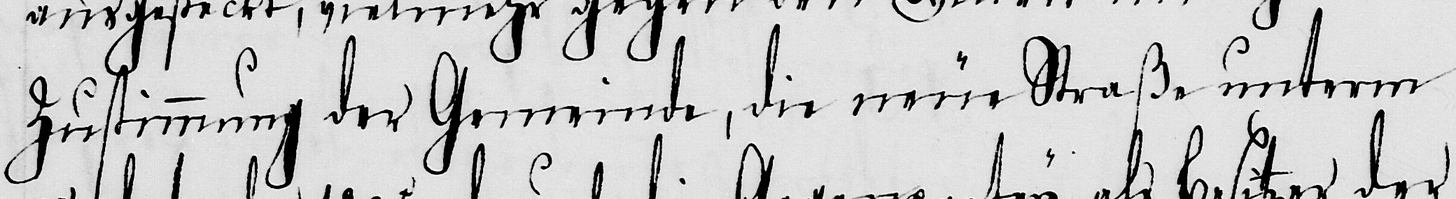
Zustimmung der Gemeinde, die neue Straße unterm
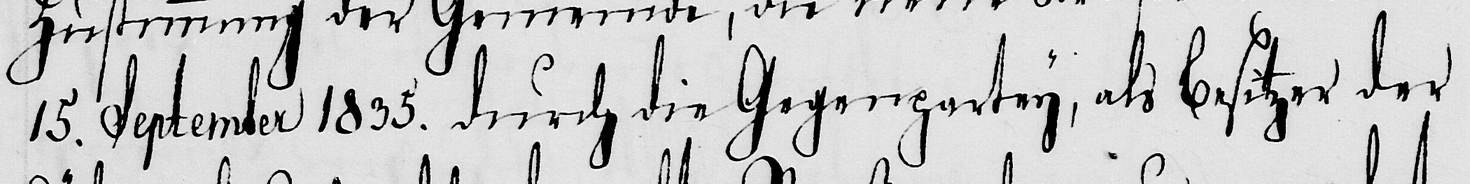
15. September 1835. durch die Gegenpartey, als Besitzer der
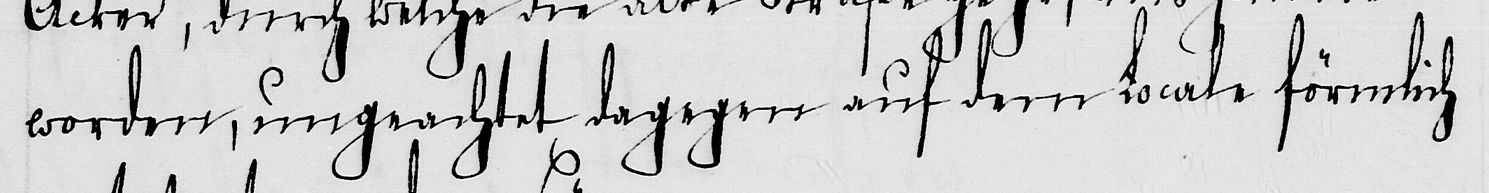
worden, ungeachtet dagegen auf dem Locale förmlich
